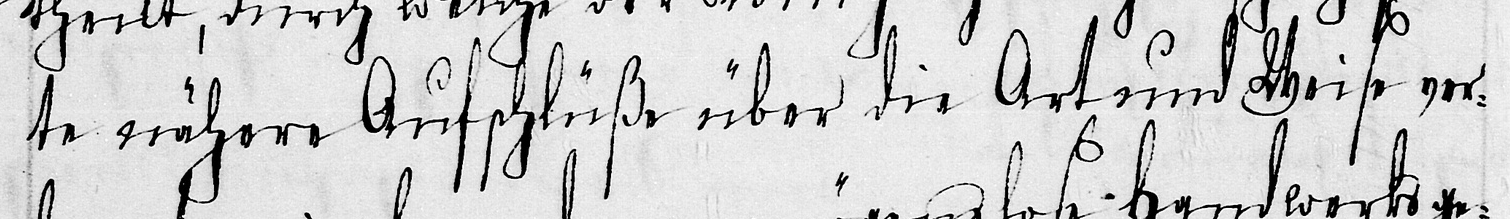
te nähere Aufschlüße über die Art und Weise ver¬
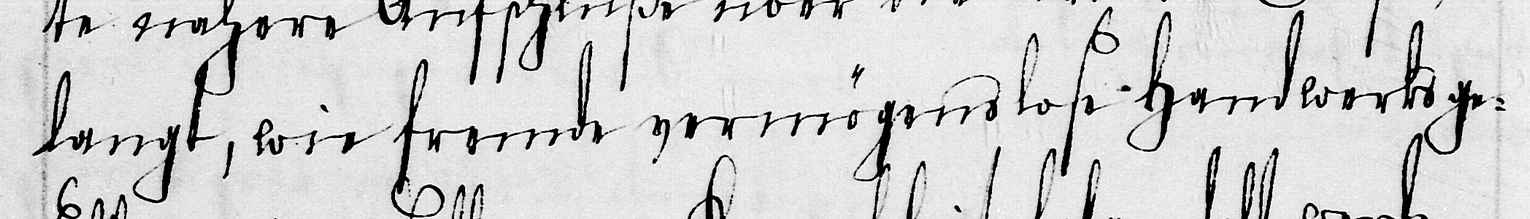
langt, wie fremde vermögenslose Handwerksge¬
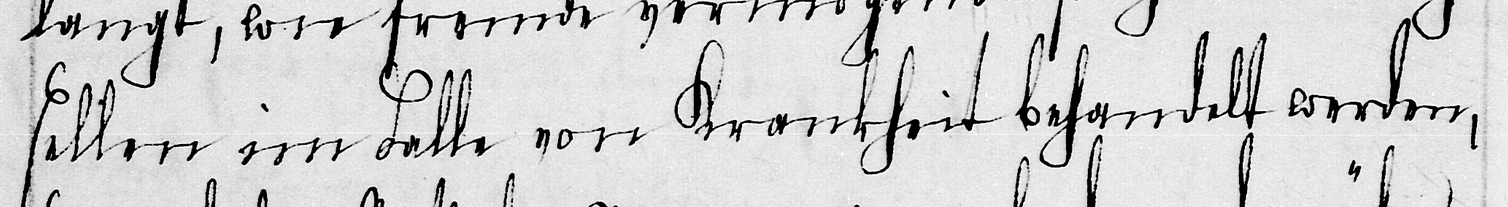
sellen im Falle von Krankheit behandelt werden,
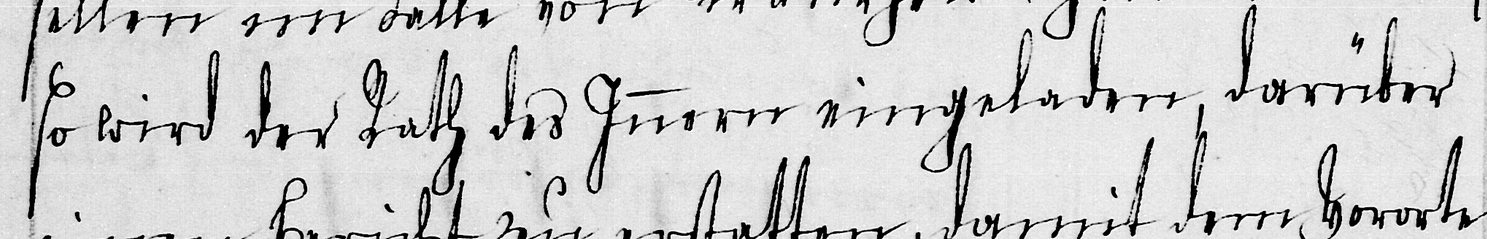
so wird der Rath des Innern eingeladen, darüber
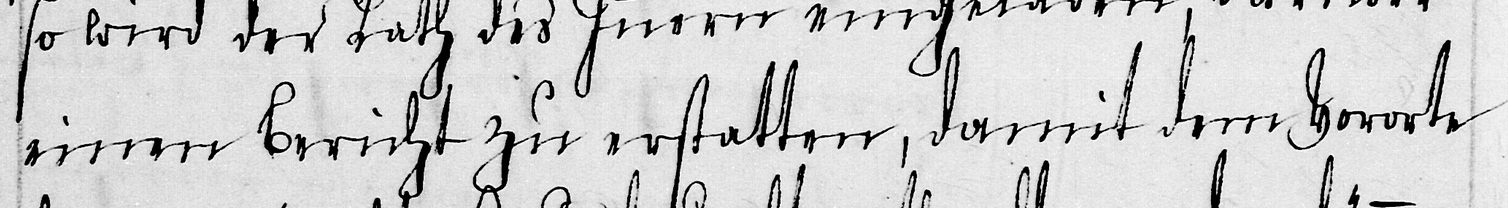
einen Bericht zu erstatten, damit dem Vororte
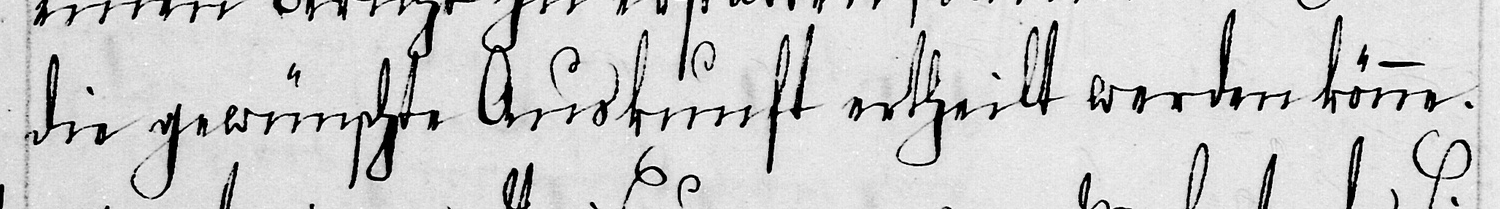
die gewünschte Auskunft ertheilt werden könne.
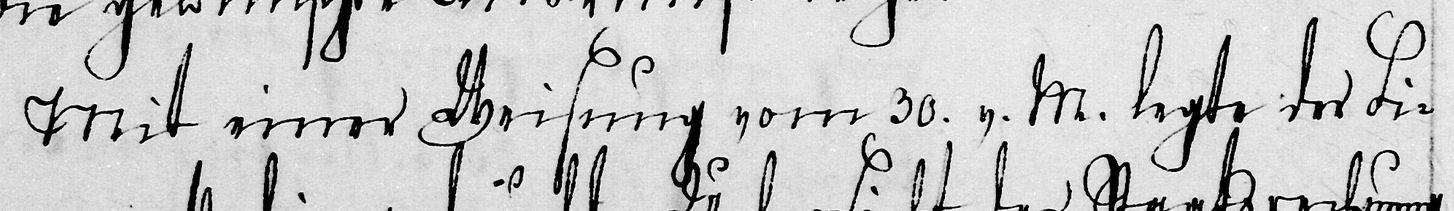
Mit einer Weisung vom 30. v. M. legte der Fi¬
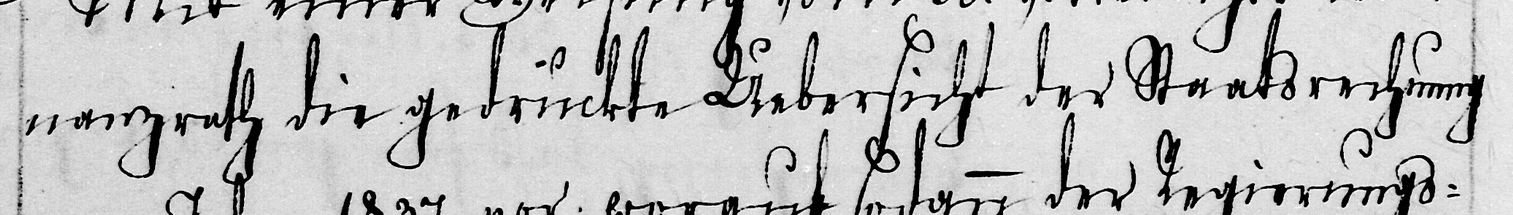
nanzrath die gedruckte Uebersicht der Staatsrechnung
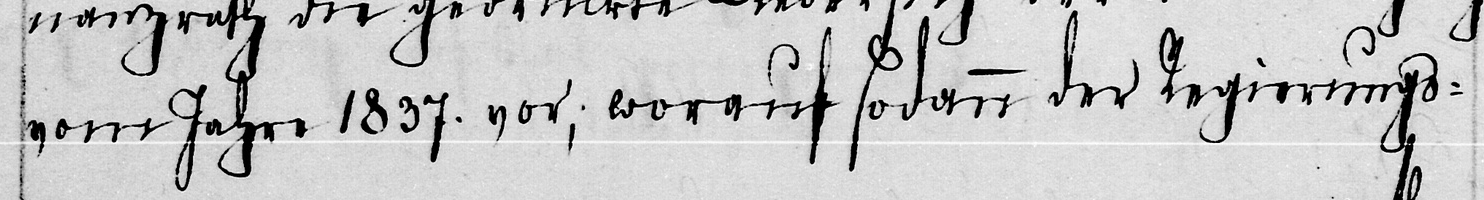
vom Jahre 1837. vor, worauf sodann der Regierungs-
